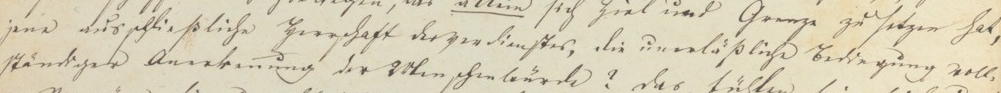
jene ausschließliche Herrschaft des Verdienstes, die unerläßliche Bedingung voll-
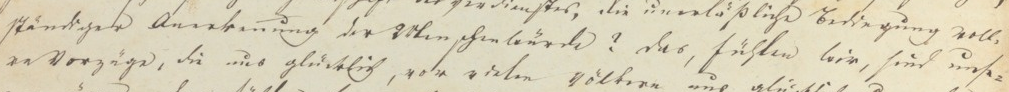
ständiger Anerkennung der Menschenwürde? Das, fühlen wir, sind unse-
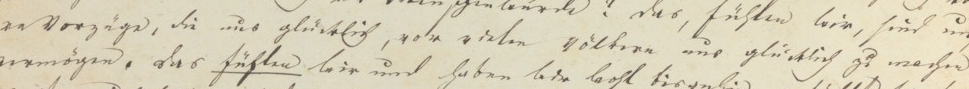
re Vorzüge, die uns glücklich, vor vielen Völkern uns glücklich zu machen
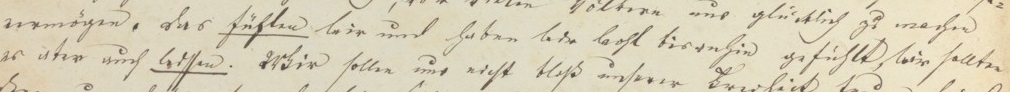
vermögen. Das fühlen wir und haben wir wohl bisanhin gefühlt, wir sollten
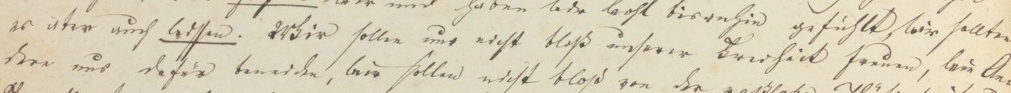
es aber auch wissen. Wir sollen uns nicht bloß unserer Freiheit freuen, wie An-
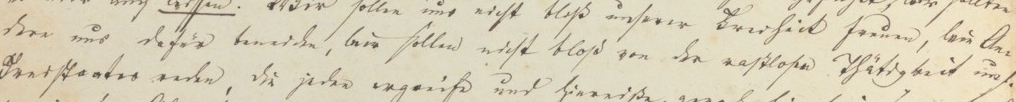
dere uns dafür beneiden, wir sollen nicht bloß von der rastlosen Thätigkeit uns.
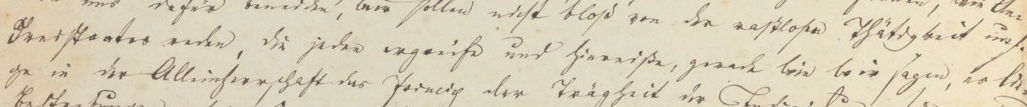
Freistaates reden, die jeden ergreife und hinreiße, gerade wie wir sagen, es lie-
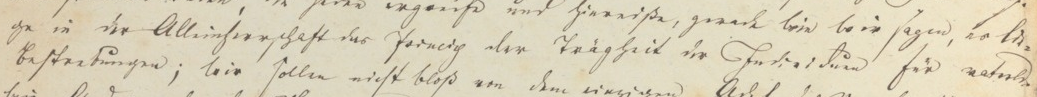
ge in der Alleinherrschaft das Princip der Trägheit der Individuen für vaterld.
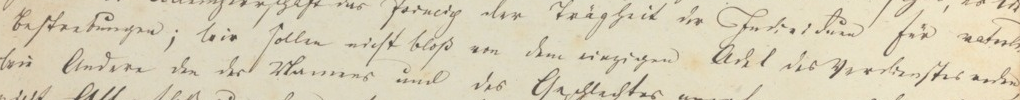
Bestrebungen; wir sollen nicht bloß von dem einzigen Akt des Verdienstes reden,
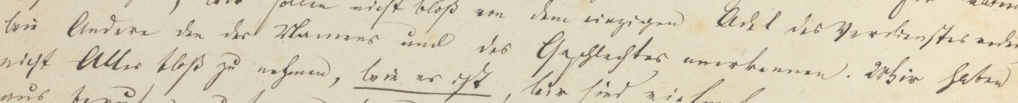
wie Andere den des Namens und des Geschlechtes anerkennen. Wir haben
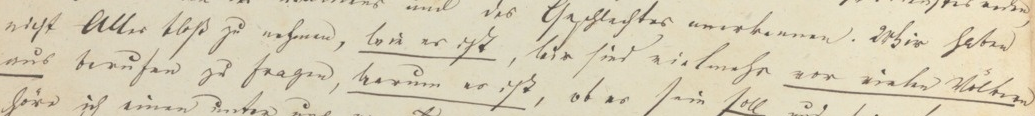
nicht Alles bloß zu nehmen, wie es ist, wir sind vielmehr vor vielen Völkern
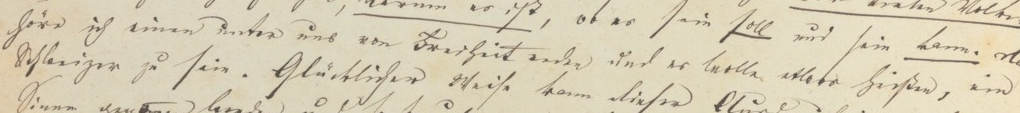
höre ich einen unter uns von Freiheit reden und es wolle etwas heißen, ein
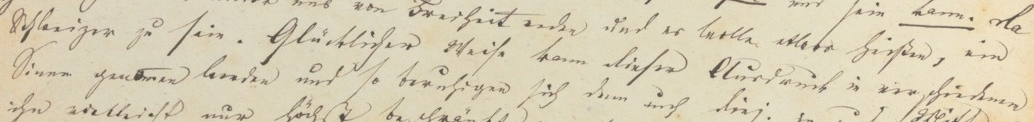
Schweizer zu sein. Glücklicher Weise kann dieser Ausdruck in verschiedenen
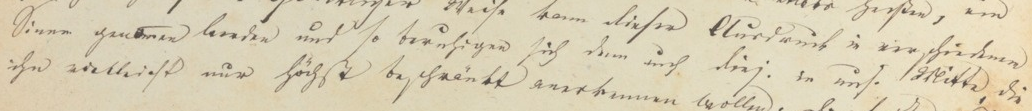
Sinne genommen werden und so beruhigen sich denn auch diej. in uns. Mitte, die
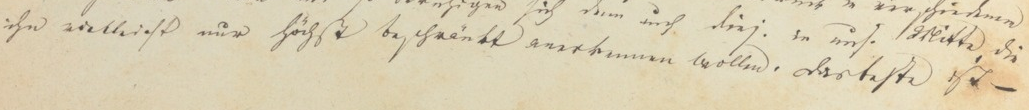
ihn vielleicht nur höchst beschränkt anerkennen wollen. Das beste ist
